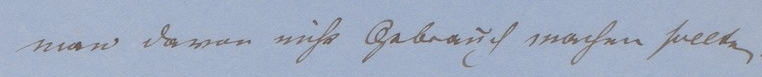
man davon nicht Gebrauch machen sollte.
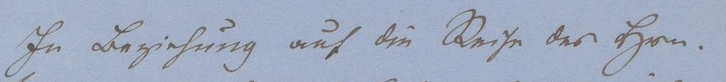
In Beziehung auf die Reise des Hrn.
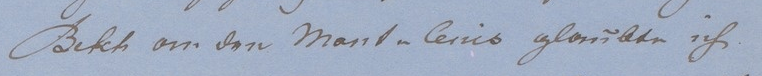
Bekh an den Mont-Cenis glaubte ich
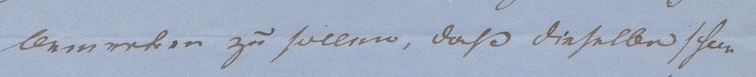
bemerken zu sollen, daß dieselbe schon
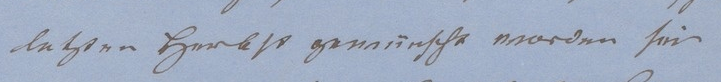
letzten Herbst gewünscht worden sei
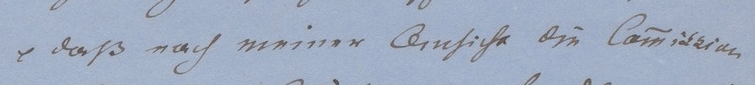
& daß nach meiner Ansicht die Commission
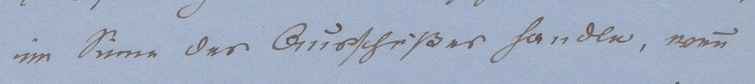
im Sinne des Ausschußes handle, wenn
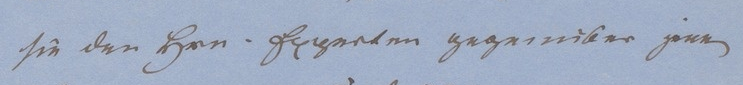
sie den Hrn. Experten gegenüber jenen
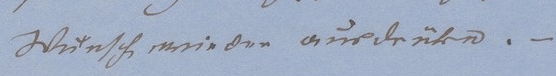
Wunsch wieder ausdrüke. –
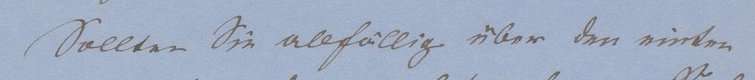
Sollten Sie allfällig über den einten
